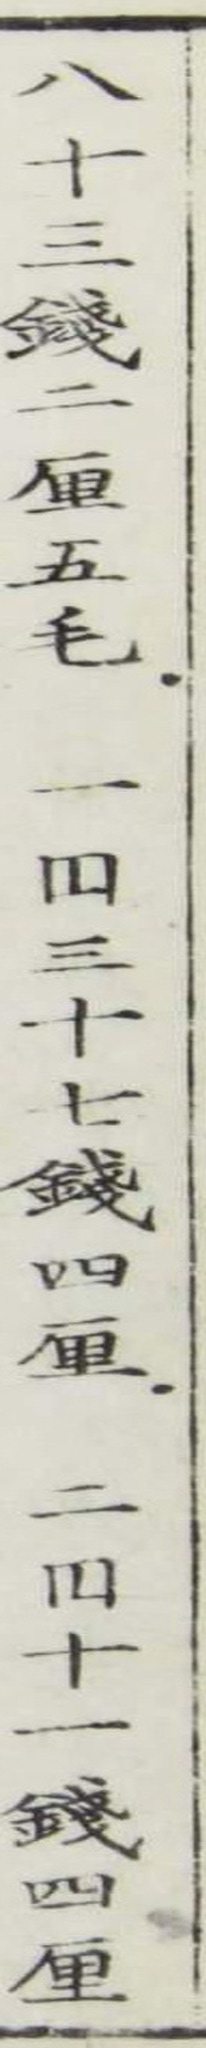八十三銭二厘五毛、一円三十七銭四厘、二円十一銭四厘
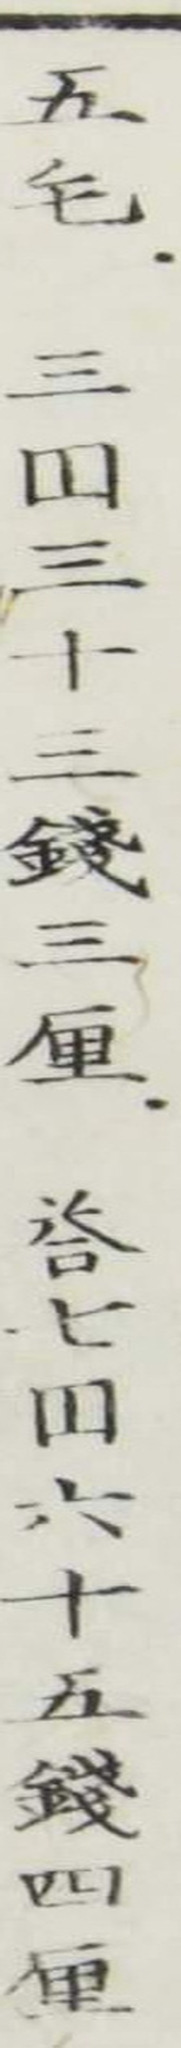五毛、三円三十三銭三厘、答七円六十五銭四厘
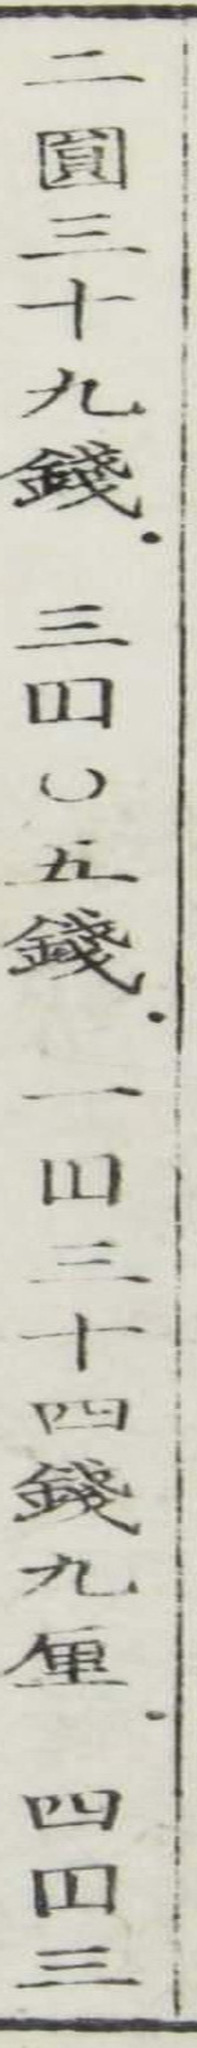二円三十九銭、三円〇五銭、一円三十四銭九厘、四円三
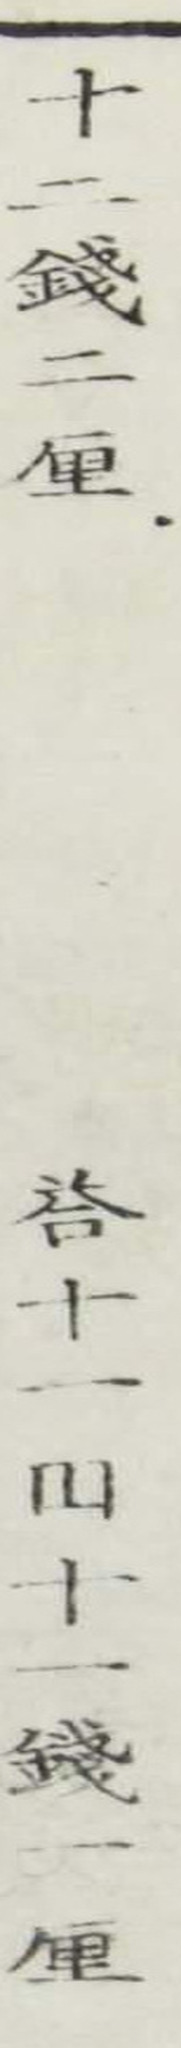十二銭二厘、答十一円十一銭一厘
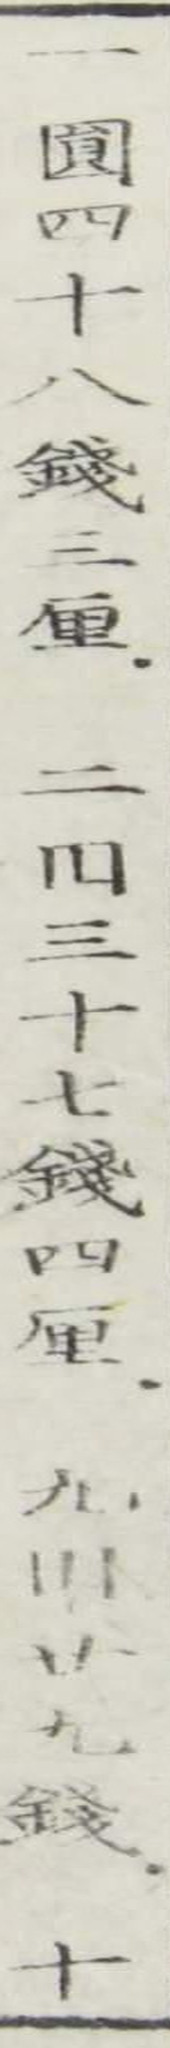一円四十八銭三厘、二円三十七銭四厘、九円廿九銭、十
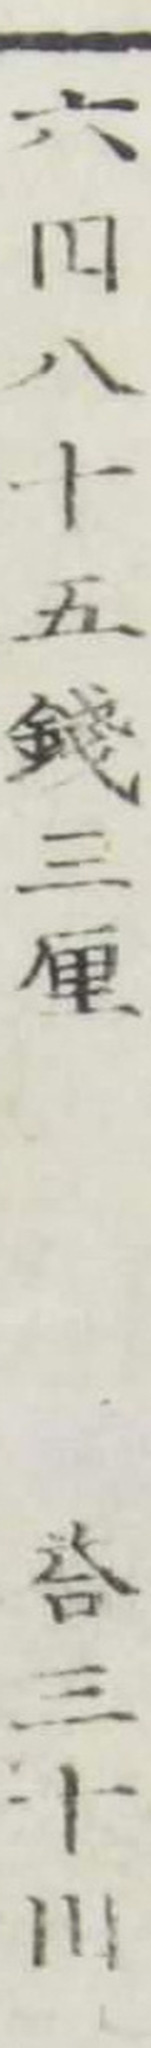六円八十五銭三厘、答三十円
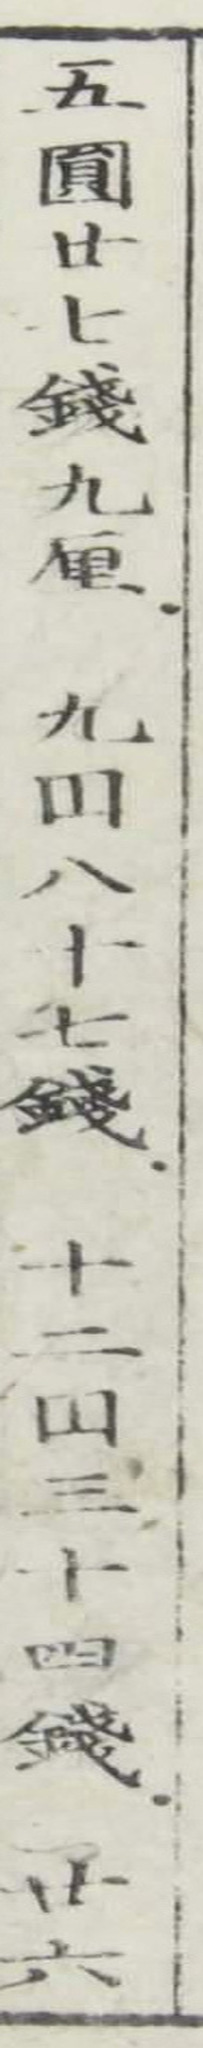五円廿七銭九厘、九円八十七銭、十二円三十四銭、廿六
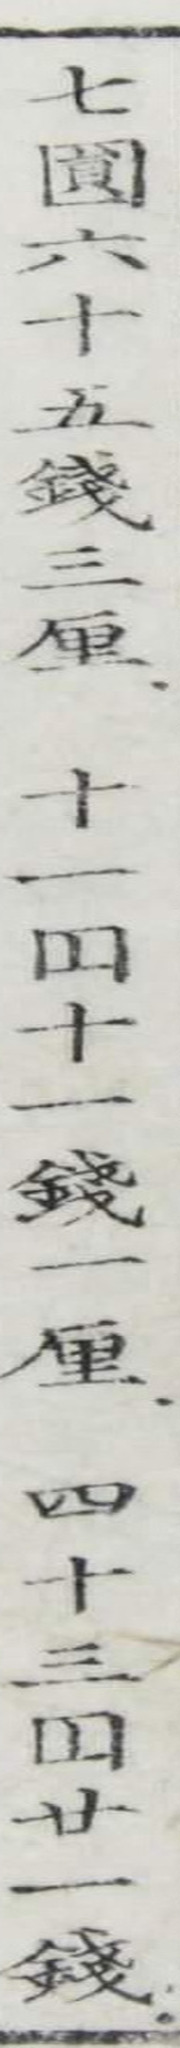七円六十五銭三厘、十一円十一銭一厘、四十三円二十一銭、
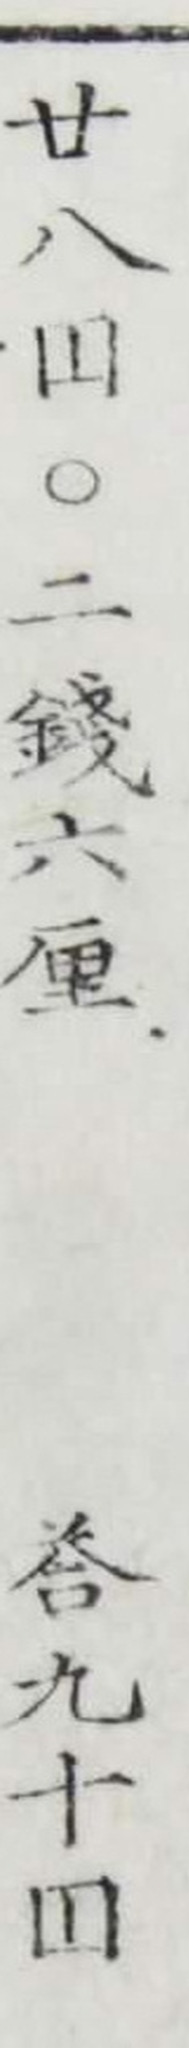廿八円〇二銭六厘、答九十円
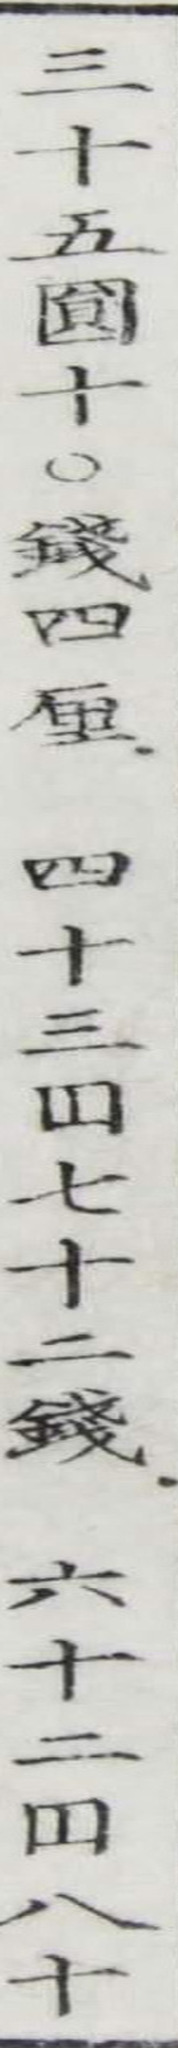三十五円十〇銭四厘、四十三円七十二銭、六十二円八十
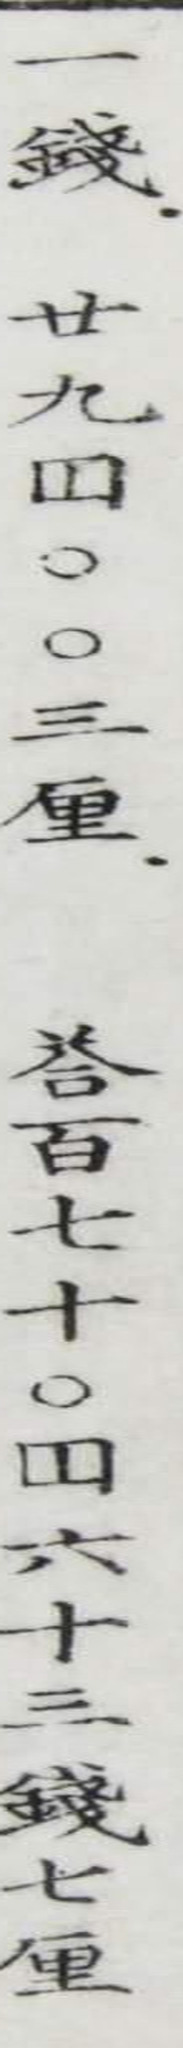一銭、廿九円〇〇三厘、答百七十〇円六十三銭七厘
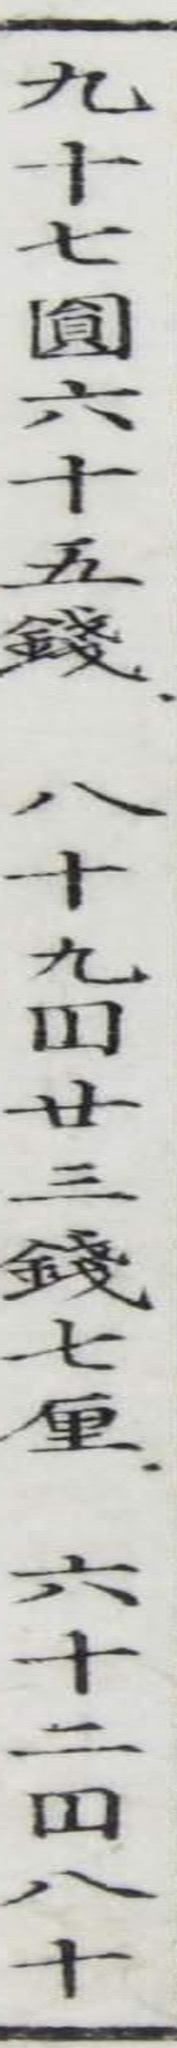九十七円六十五銭、八十九円廿三銭七厘、六十二円八十
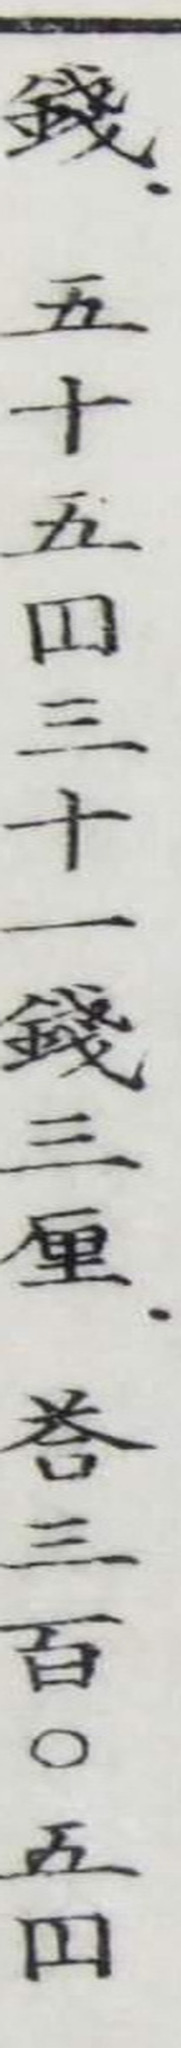銭、五十五円三十一銭三厘、答三百〇五円
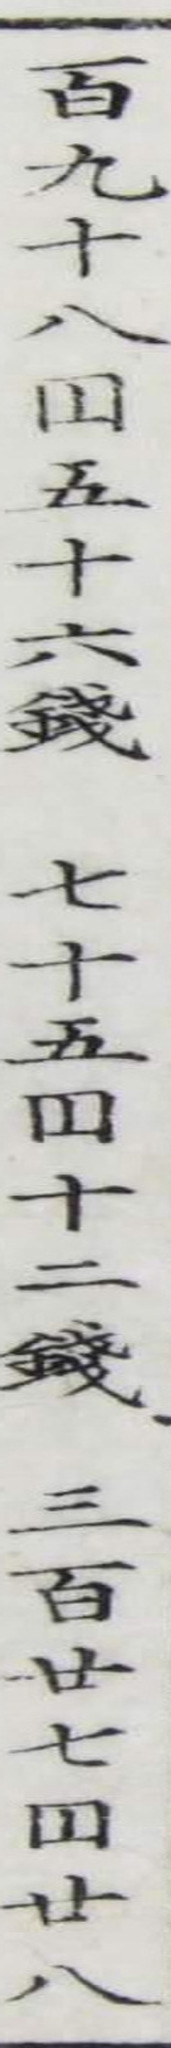百九十八円五十六銭、七十五円十二銭、三百廿七円廿八
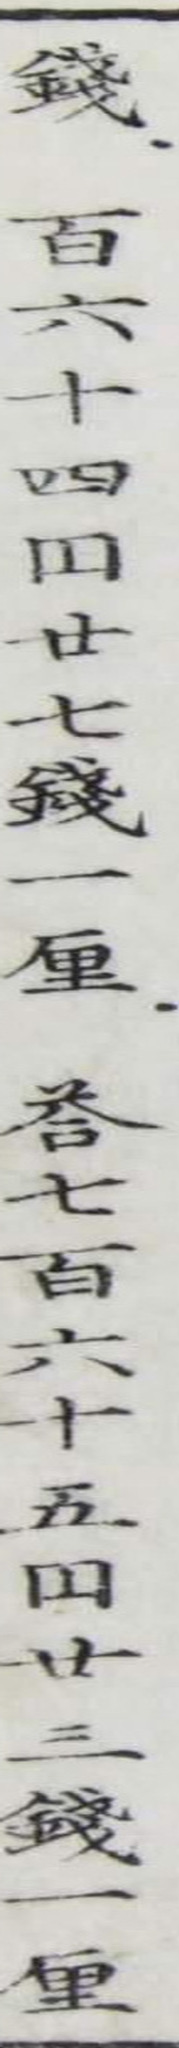銭、百六十四円廿七銭一厘、答七百六十五円廿三銭一厘
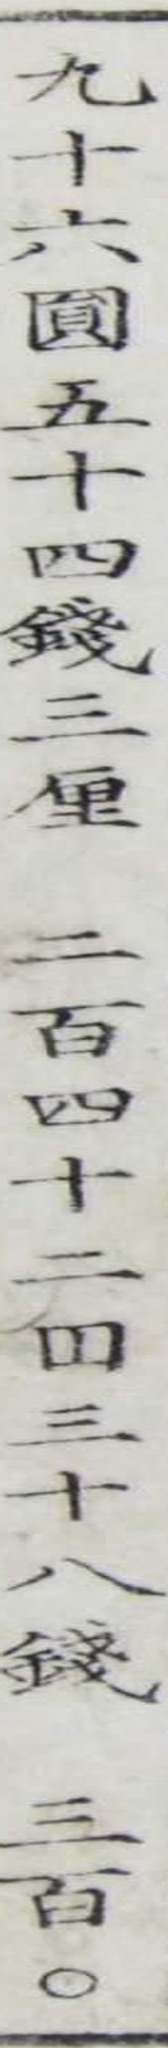九十六円五十四銭三厘、二百四十二円三十八銭、三百〇
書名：明治小學塵劫記 卷1
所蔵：東京学芸大学教育コンテンツアーカイブ
